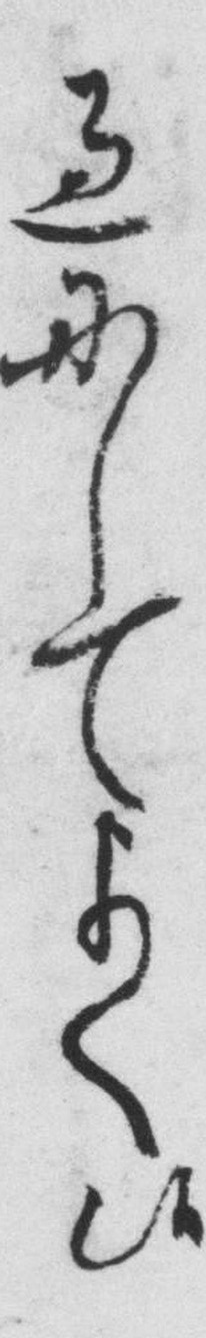過にしてよく候
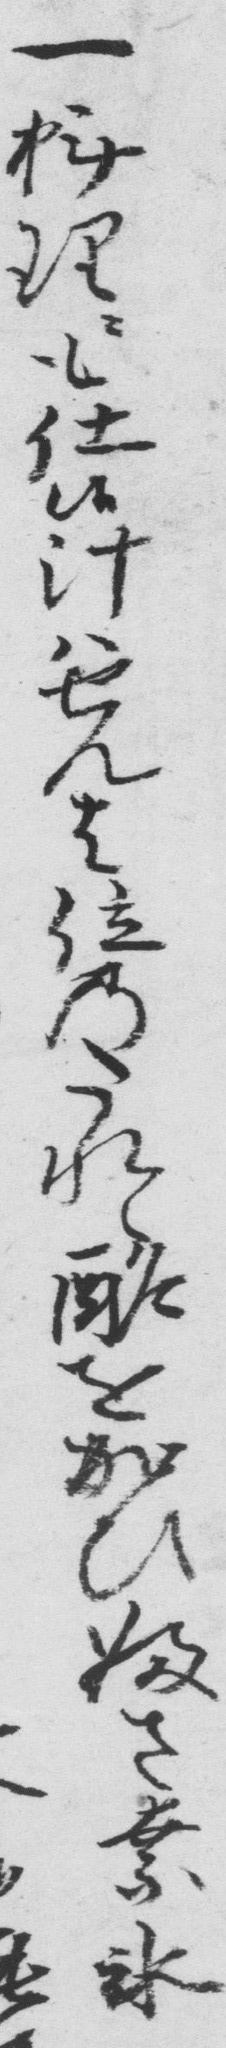一料理にも仕候汁はせんは位のたれ酢を加ひふさ葉氷
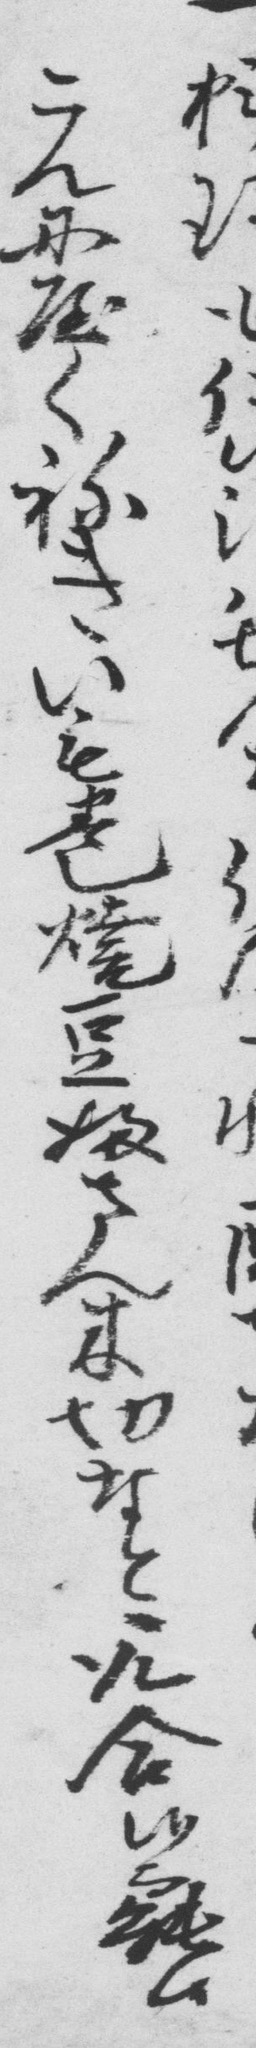こんにやくねきいもすし焼豆腐さん木切なと取合候て能候
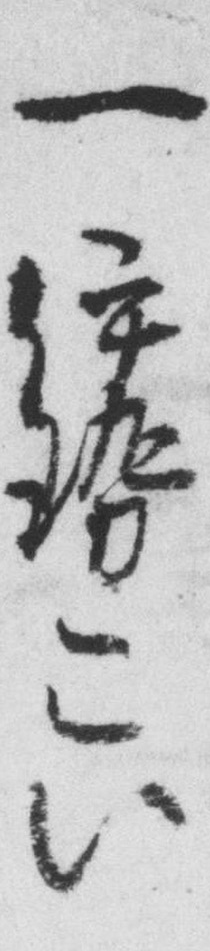一伊勢こい
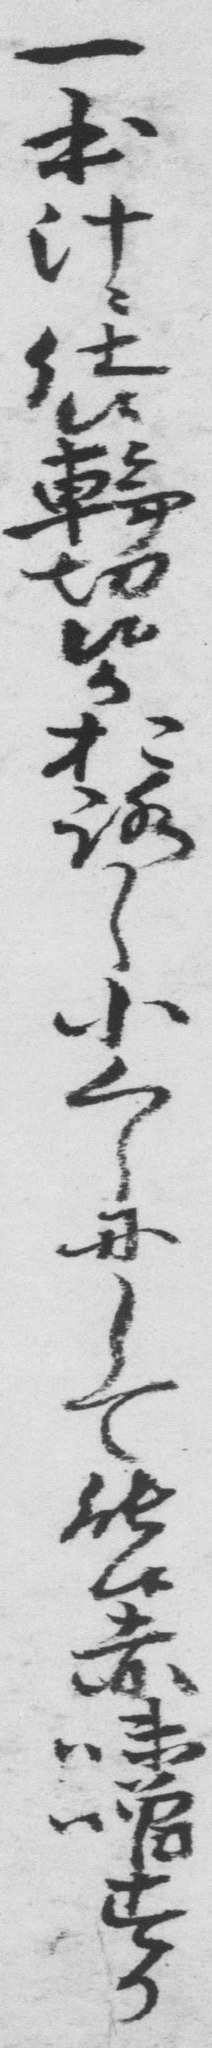一本汁に仕候輪切候かおろし小くしにして能候赤味噌すり
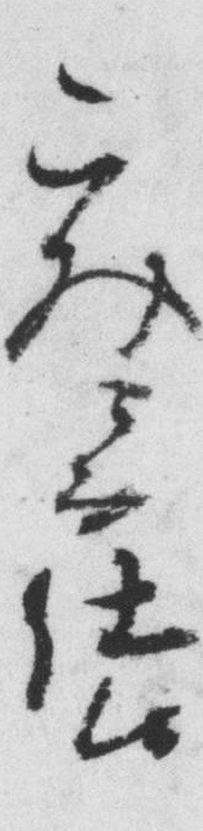こみにて仕候
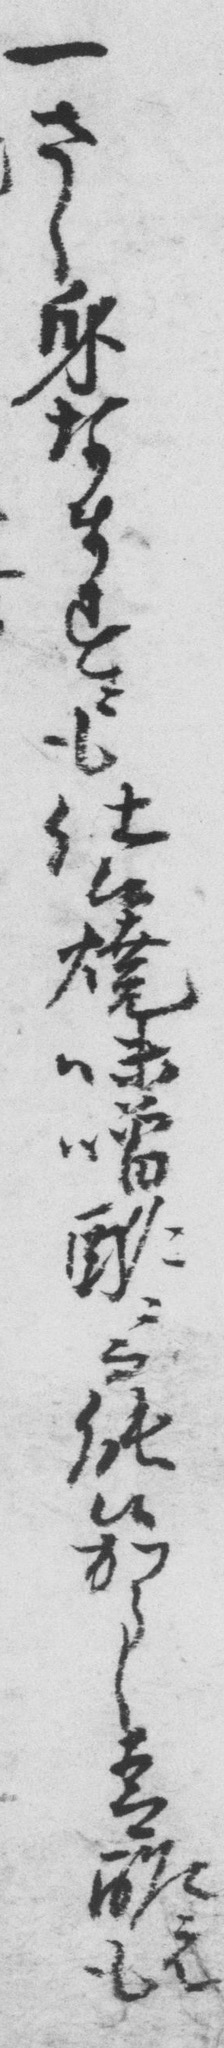一さし身なますにも仕候焼味噌酢にて能候からし青酢えも
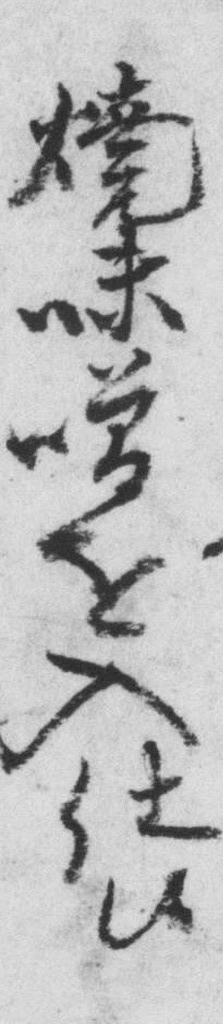焼味噌を入仕候

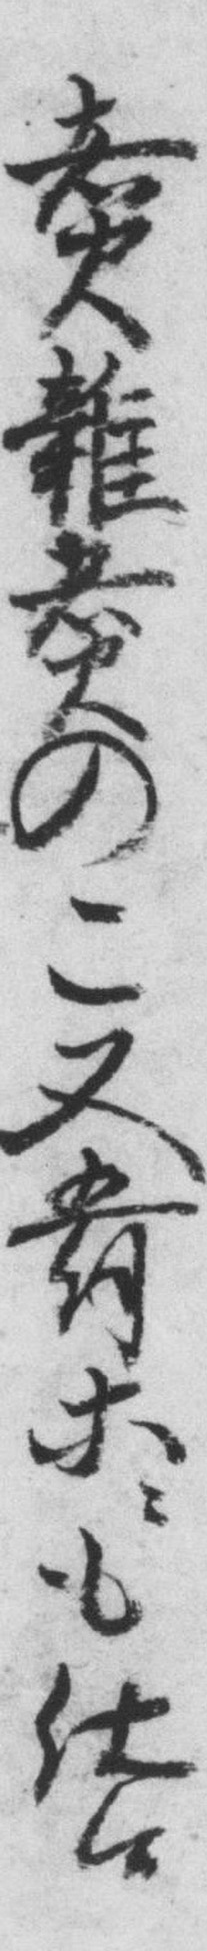煮雑煮のこ又肴等にも仕候
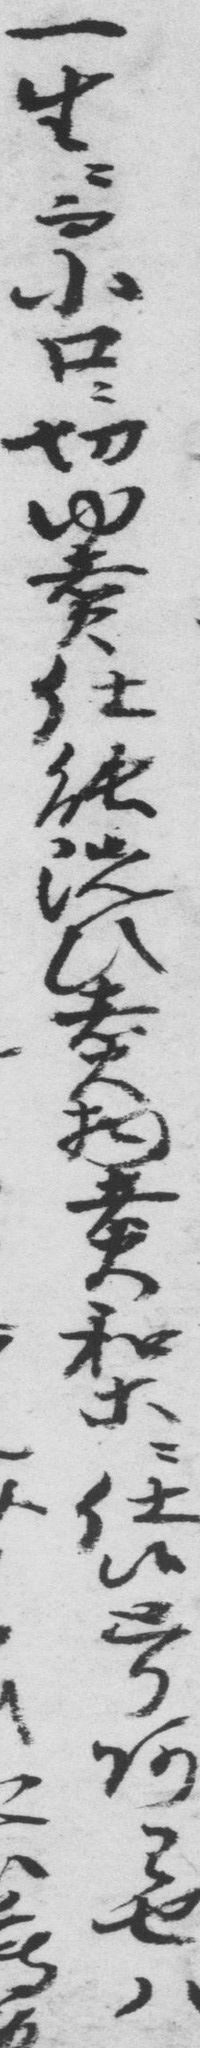一生にて小口に切ゆ煮仕能洗ひ煮物煮和等にも仕候とりあわせは
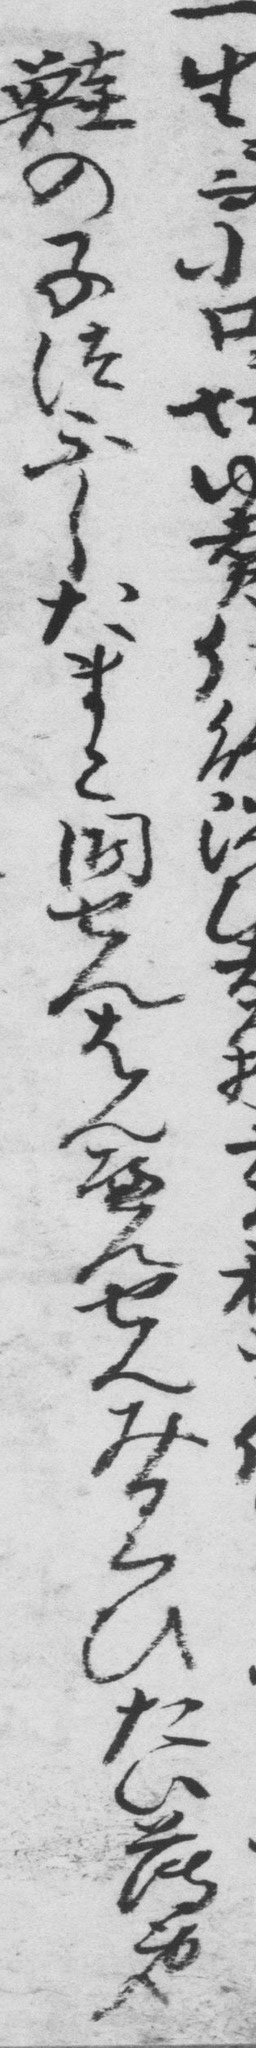鮭の子つふしたまこ同せんはんへんせんみるくひたい薄身
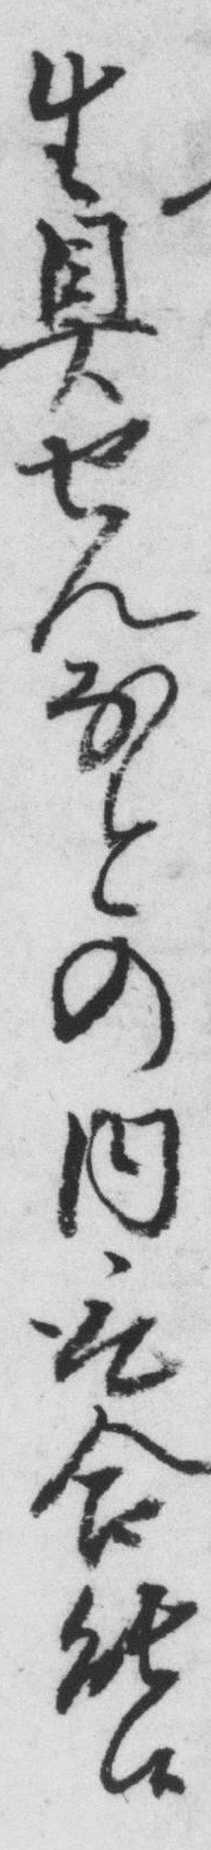生貝せんなとの内取合能候
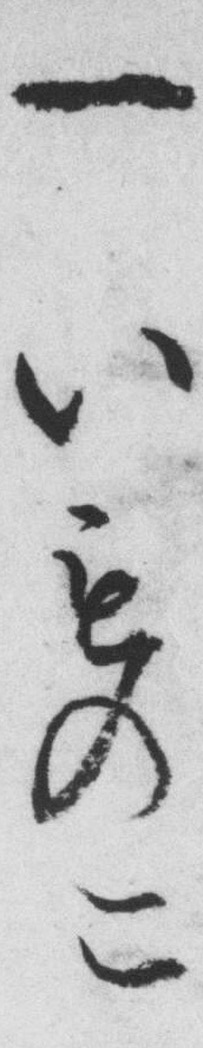一いものこ
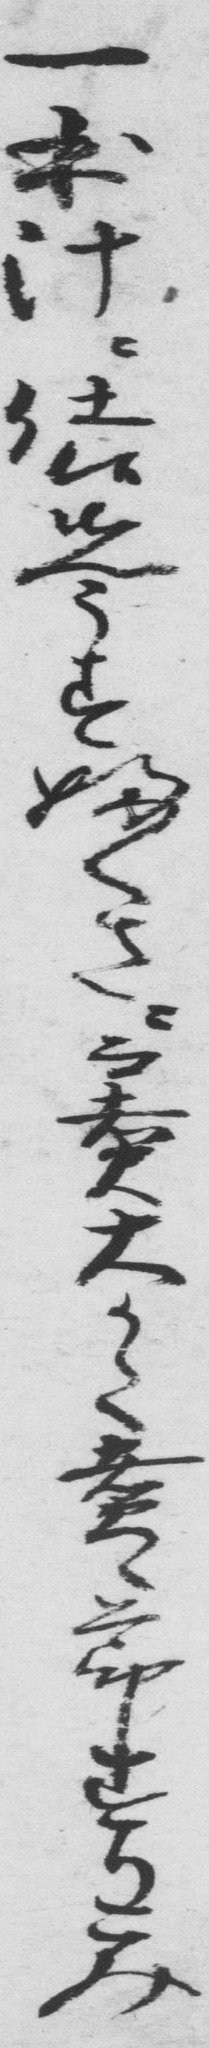一本汁に仕候先うすふくさにて煮大かた煮候節すりこみ
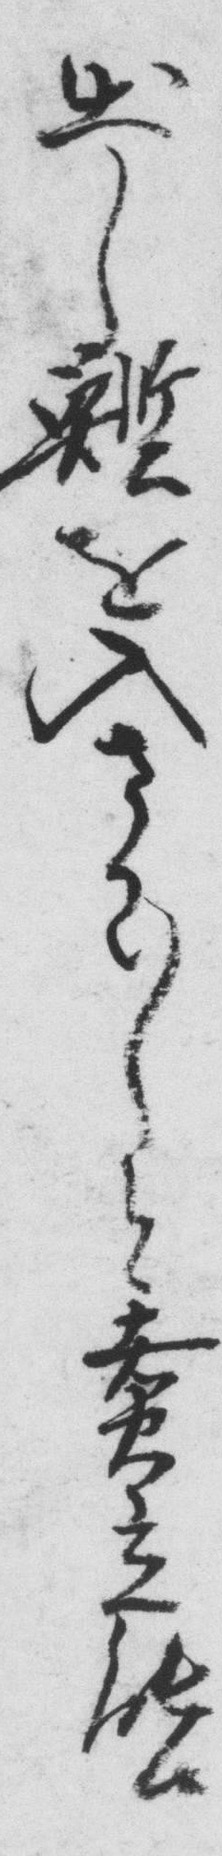出し鰹を入さわ〳〵と煮立能候
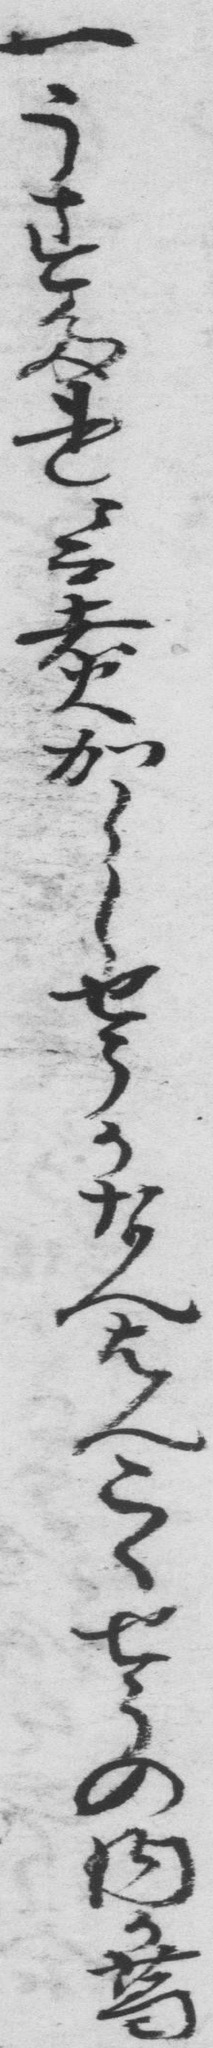一うすたれにて煮からしせうかなんはんこくせうの内か葛
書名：料理集
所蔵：大阪府立大学学術情報センター 国文学研究資料館
